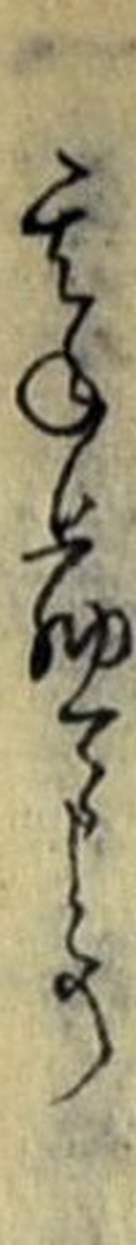其年上納可申事

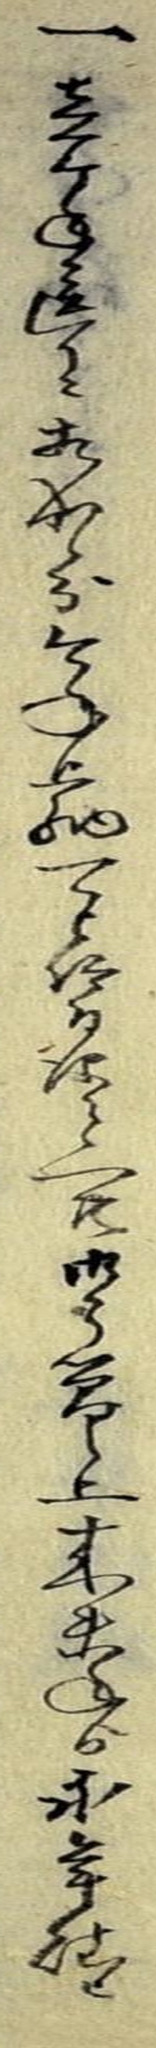一壱ケ年送りニ相成候分今年上納可被仰付儀ニ候へ共御了簡之上来未年ゟ永年賦被
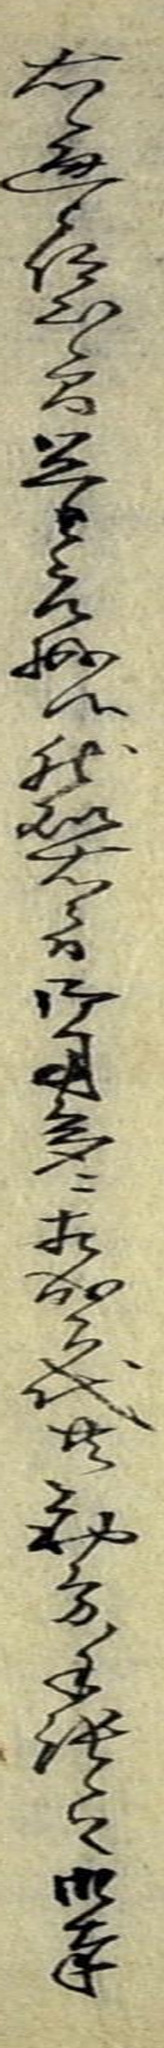右之通被仰出候間宜被取扱候然処右ニ付御用多ニ相成下代共勤方手張候ハヽ御奉
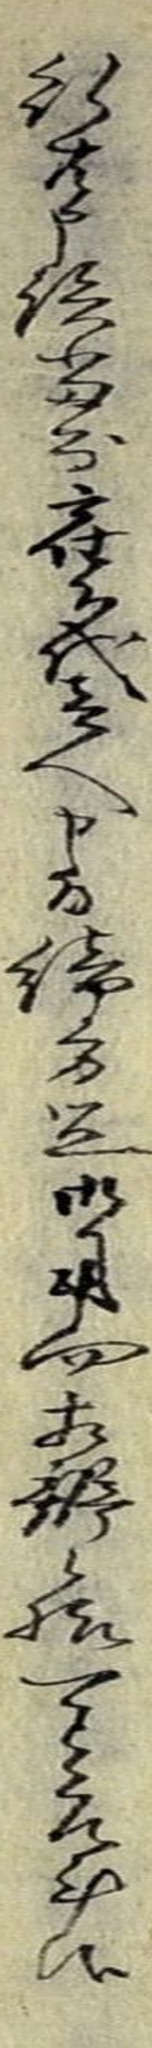行共申談当分雇下代壱人申付締方宜御用向相弁候様可被取計候
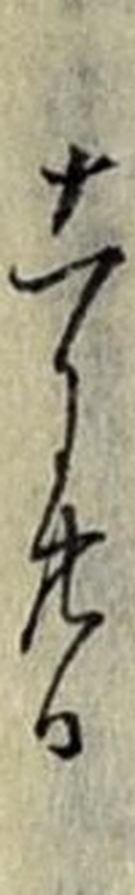十一月廿日
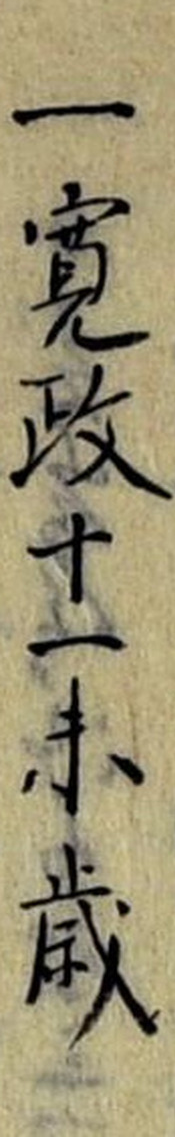一寛政十一未歳
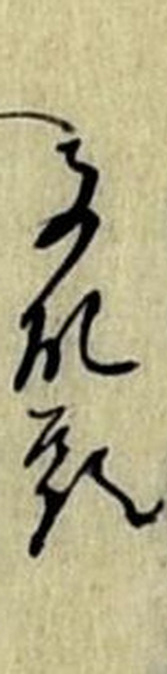支配頭
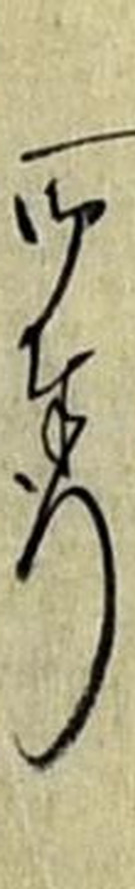御奉行
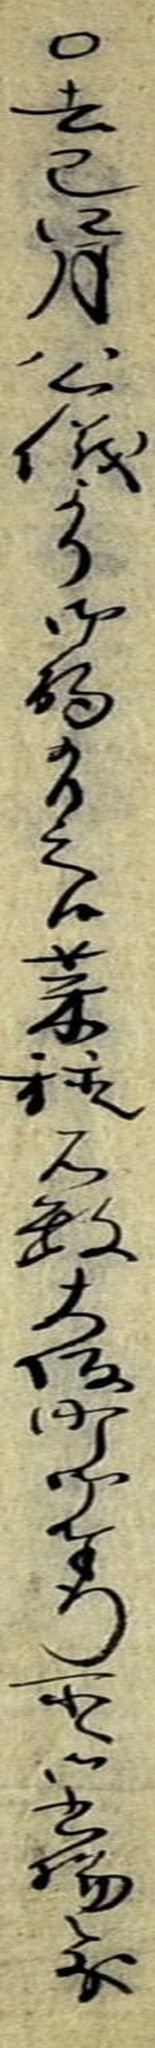○去巳四月公儀より御触有之候菜種石数大坂町御奉行所へ御書揚之義
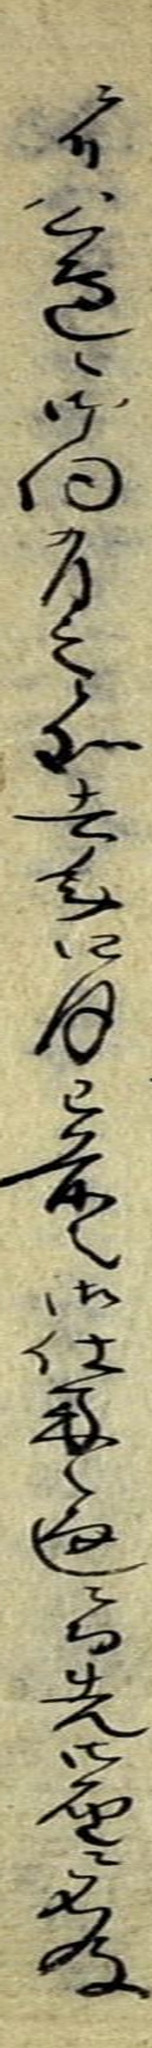ニ付公辺へ御伺有之候処去年四月已前之御仕来之通ニ而先御届ニ不及
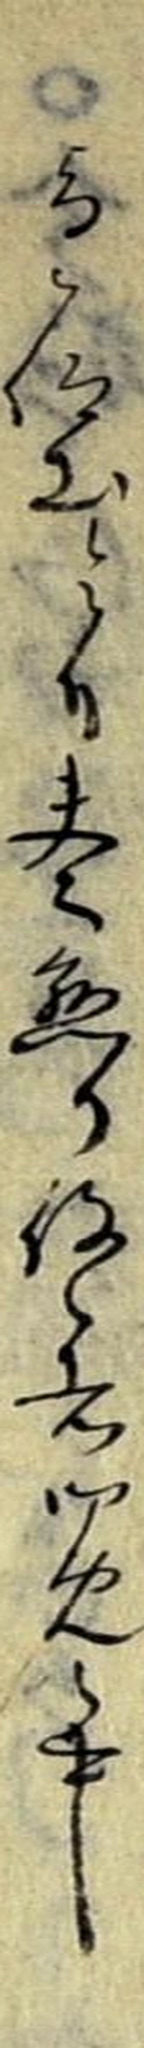旨被仰出候ニ付夫々懸り役之者御免候事
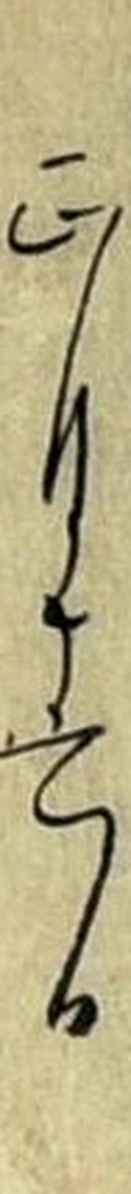正月十六日
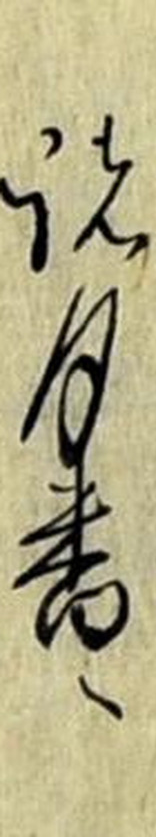諸月番へ
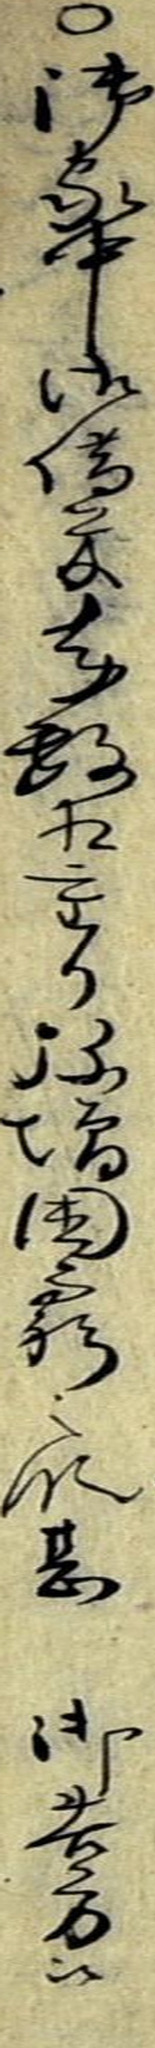○御家中御借米年数相重り弥増困窮之段甚御苦方被
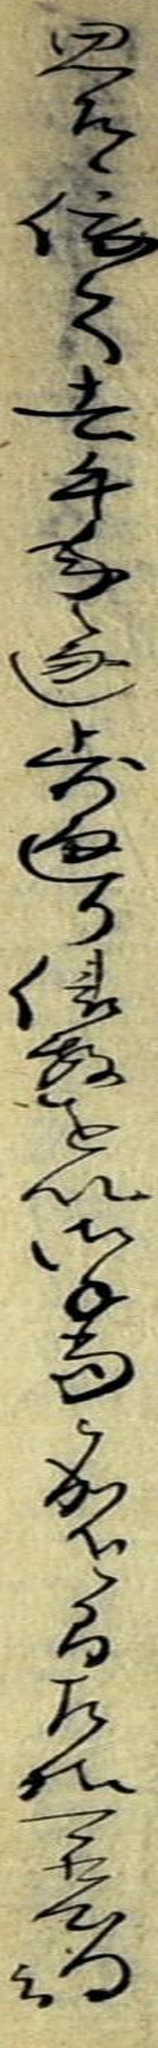思召候依之去午年之通歩通り俵数を以御手当被成下候間左様可相心得旨

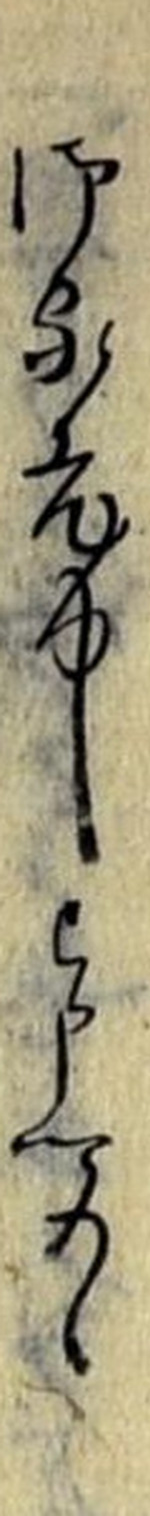御家老中被申聞候
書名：命令之部 三
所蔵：福井県文書館 Fukui Prefectural Archives
